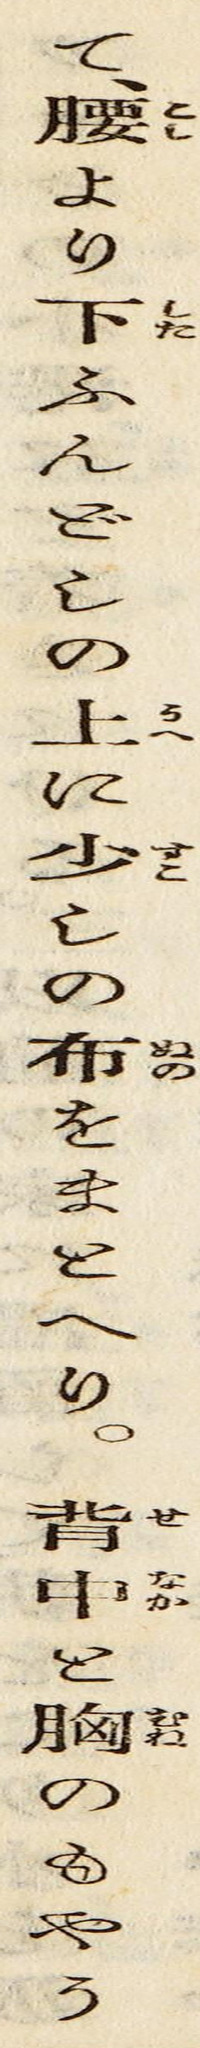て、腰より下ふんどしの上に少しの布をまとへり。背中と胸のもやう
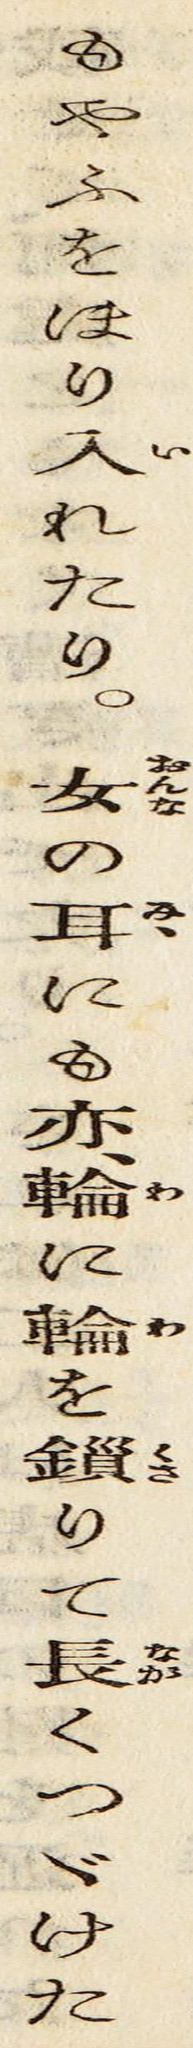もやふをほり入れたり。女の耳にも亦、輪に輪を鎖りて長くつヾけた
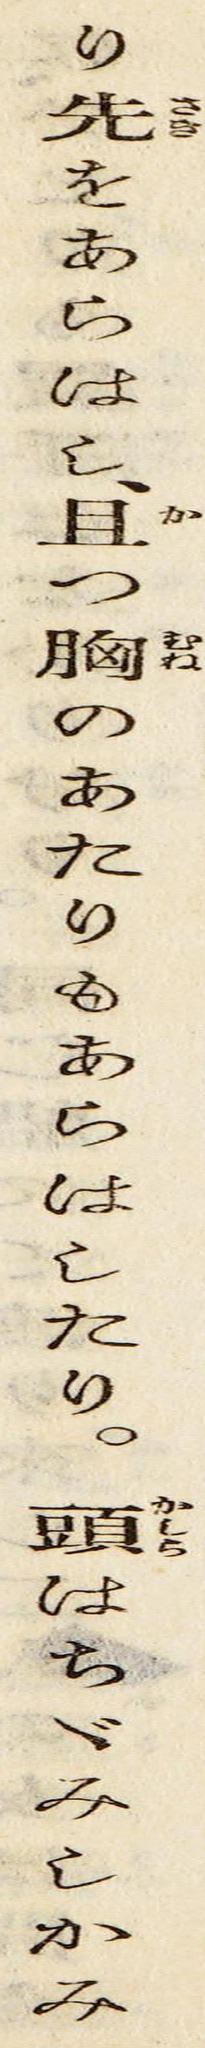り先をあらはし、且つ胸のあたりもあらはしたり。頭はちヾみしかみ
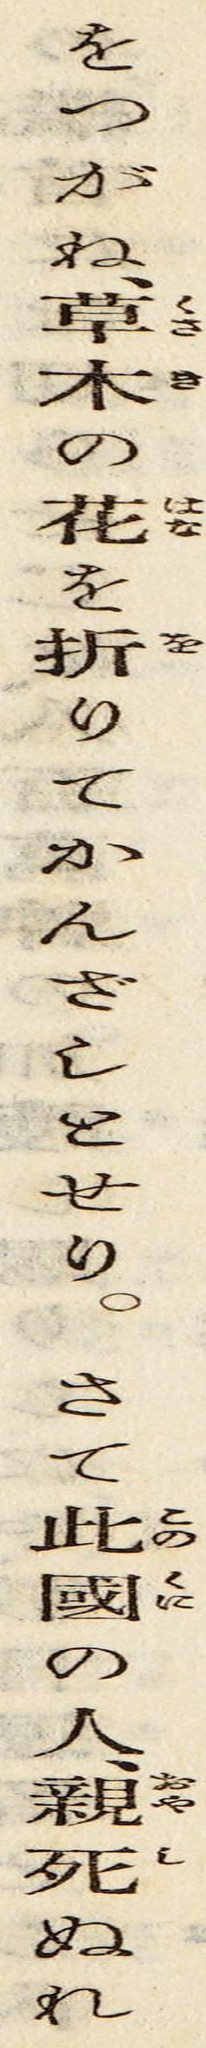をつがね、草木の花を折りてかんざしとせり。さて此国の人、親死ぬれ
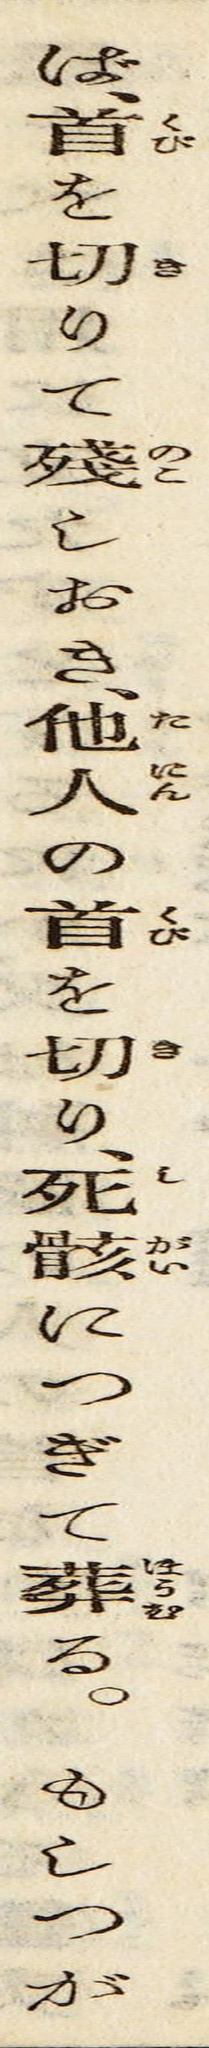ば、首を切りて残しおき、他人の首を切り、死骸につぎて葬る。もしつが
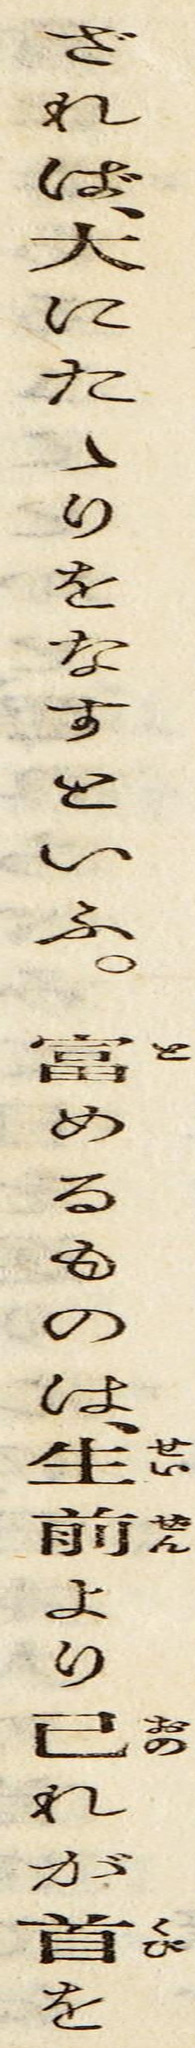ざれば、大にたゝりをなすといふ。富めるものは、生前より已れ首を
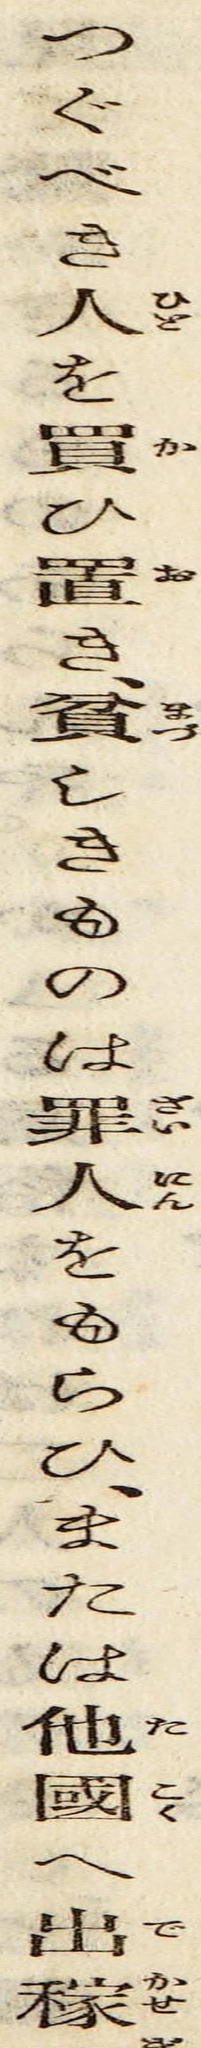つぐべき人を買ひ置き、貧しきものは罪人をもらひ、または他国へ出稼
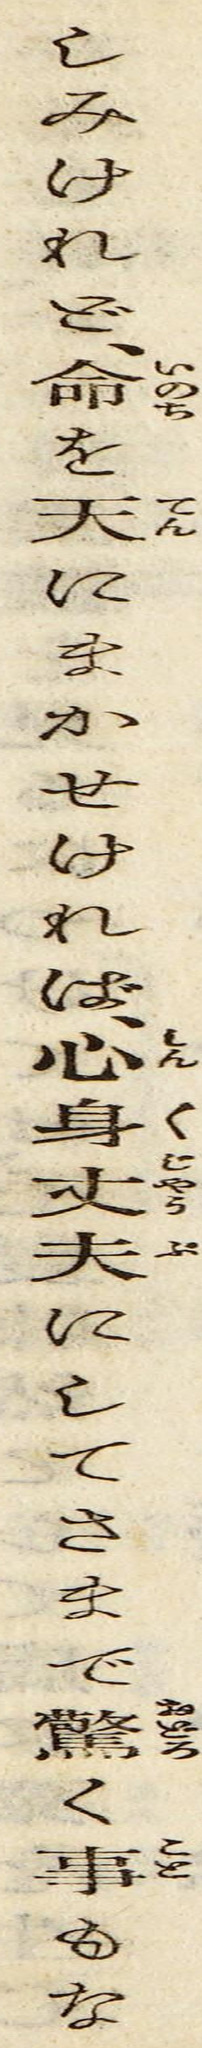しみけれど、命を天にまかせければ、心身丈夫にしてさまで驚く事もな

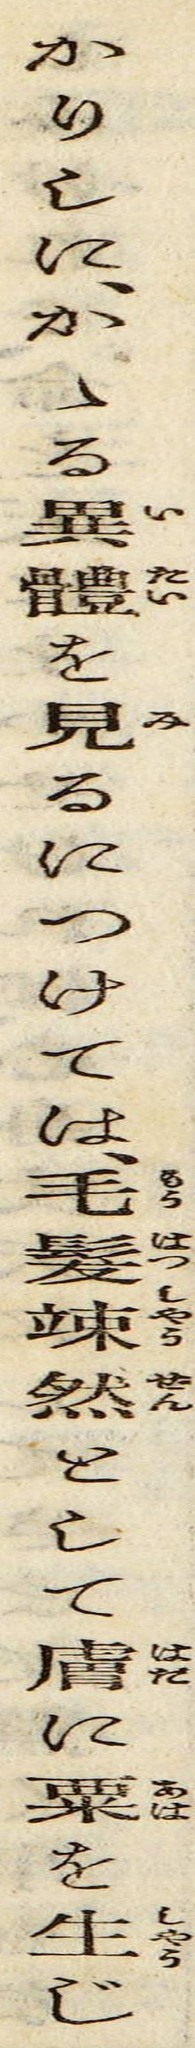かりしに、かゝる異体を見るにつけては、毛髪竦然として膚に粟を生じ
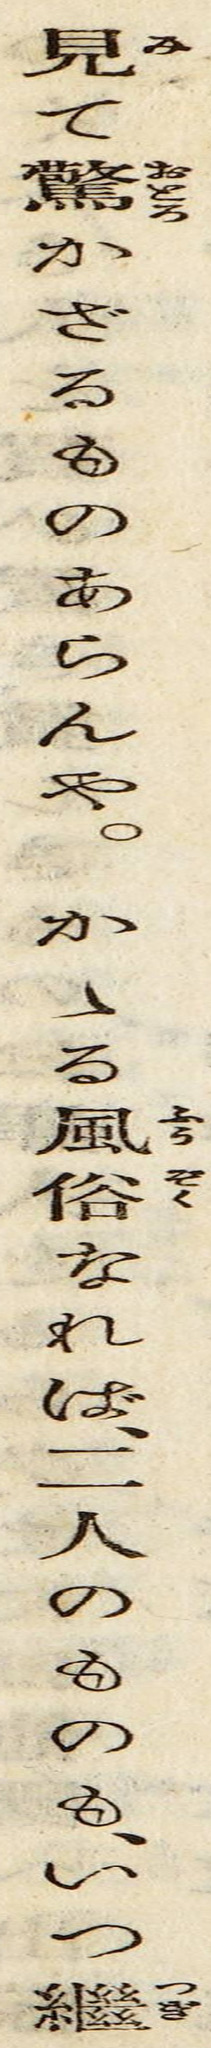見て驚かざるものあらんや。かゝる風俗なれば、二人のものも、いつ継
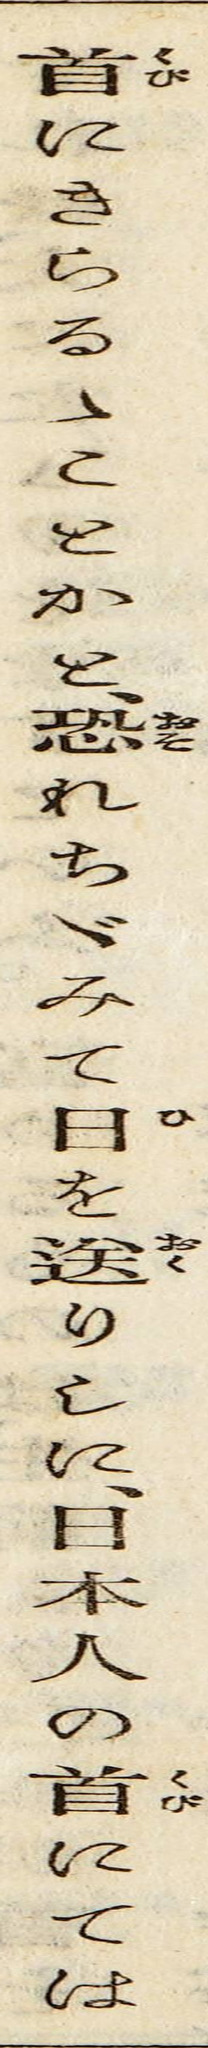首にきらるゝことかと、恐れちヾみて日を送りしに、日本人の首にては
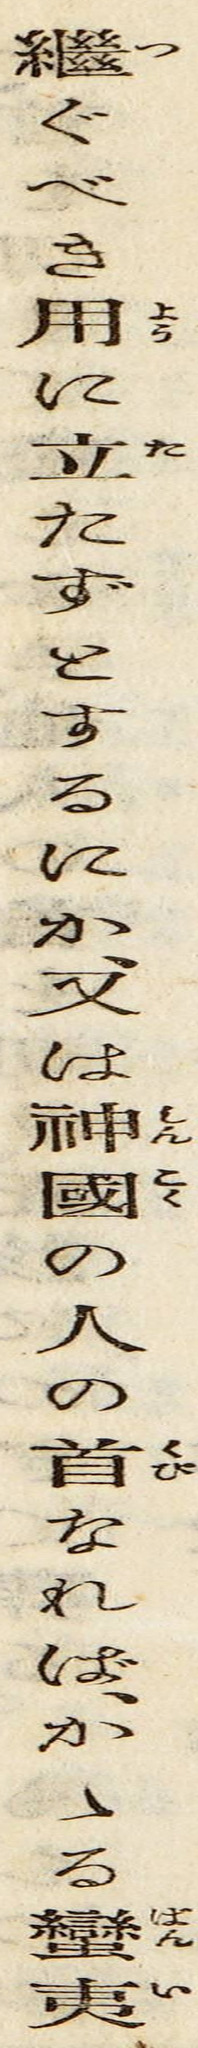継ぐべき用に立たずとするにか、又は神国の人の首なれば、かゝる蛮夷
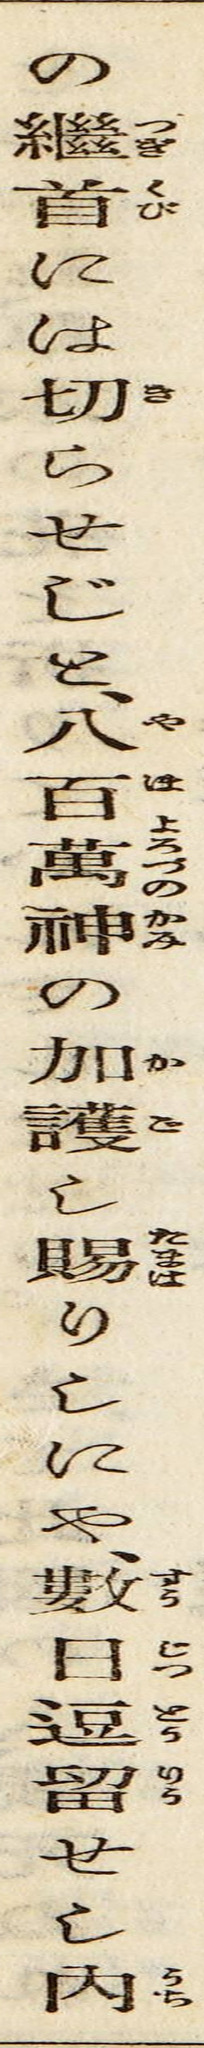の継首には切らせじと、八百万神の加護し賜りしにや、数日逗留せし内
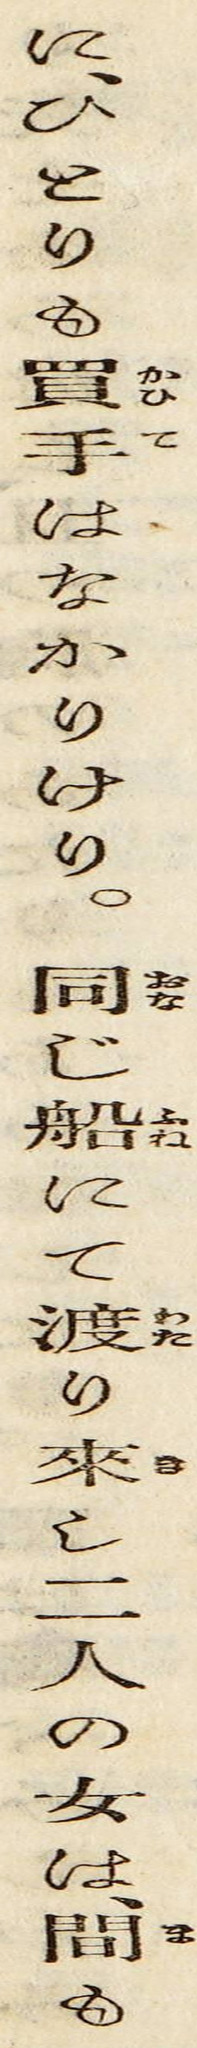に、ひとりも買手はなかりけり。同じ船にて渡り来し二人の女は、間も
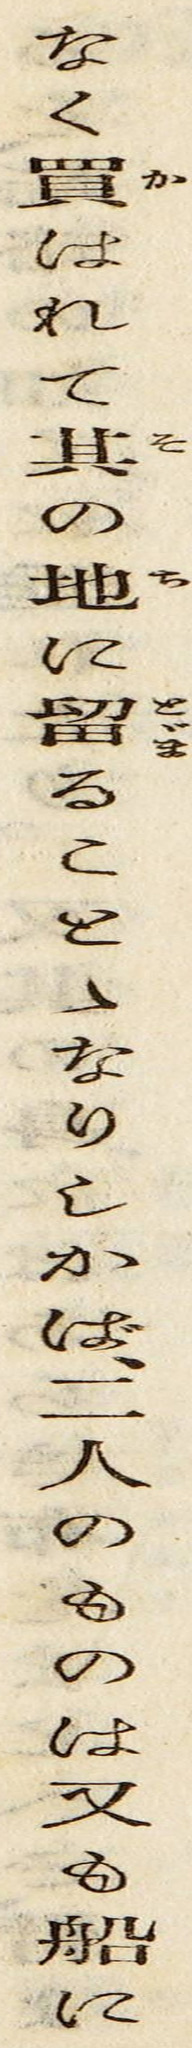なく買はれて其の地に留ることゝなりしかば、二人のものは又も船に
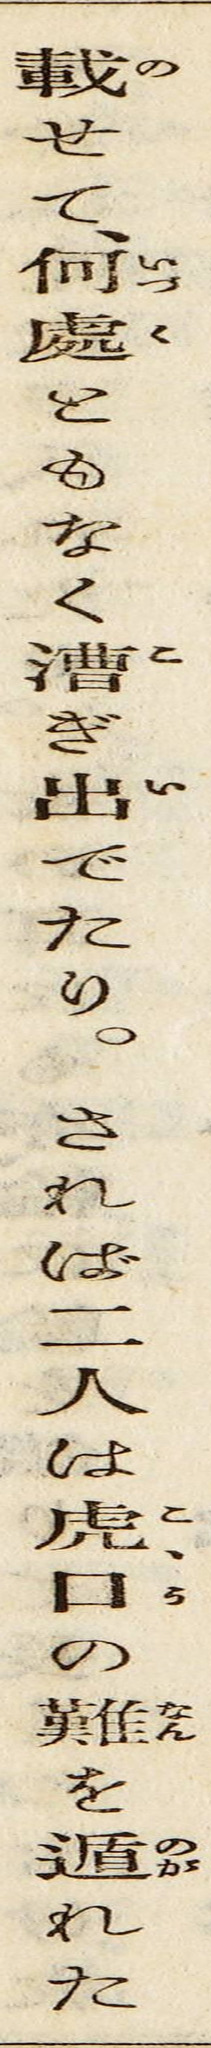載せて、何処ともなく漕ぎ出でたり。されば二人は虎口の難を遁れた
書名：日本漂流譚
